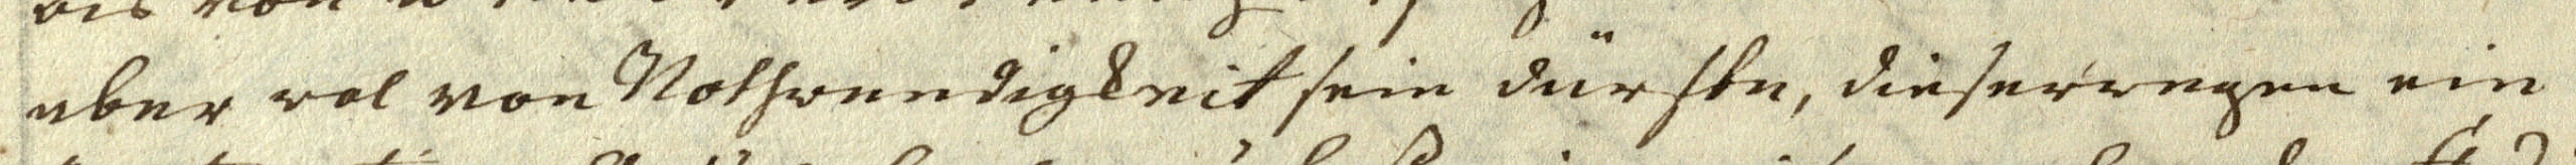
aber wol von Nothwendigkeit sein dürfte, dieserwegen ein
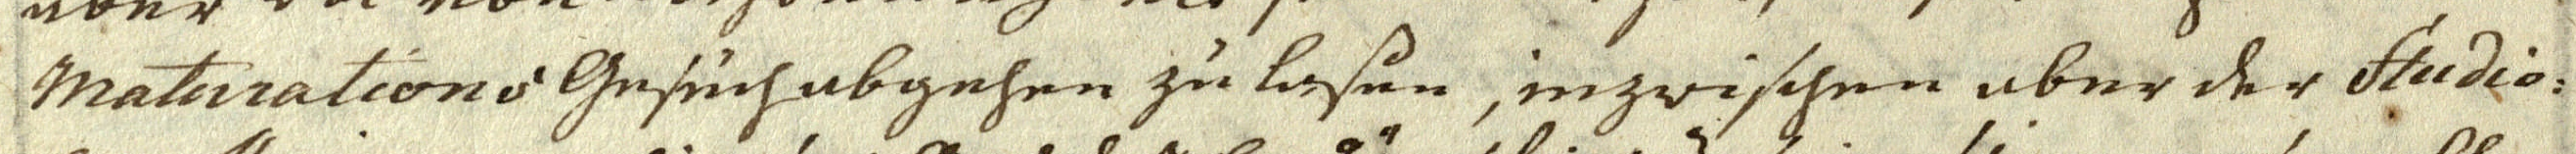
Maturationsgesuch abgehen zu laßen, inzwischen aber der Studio¬
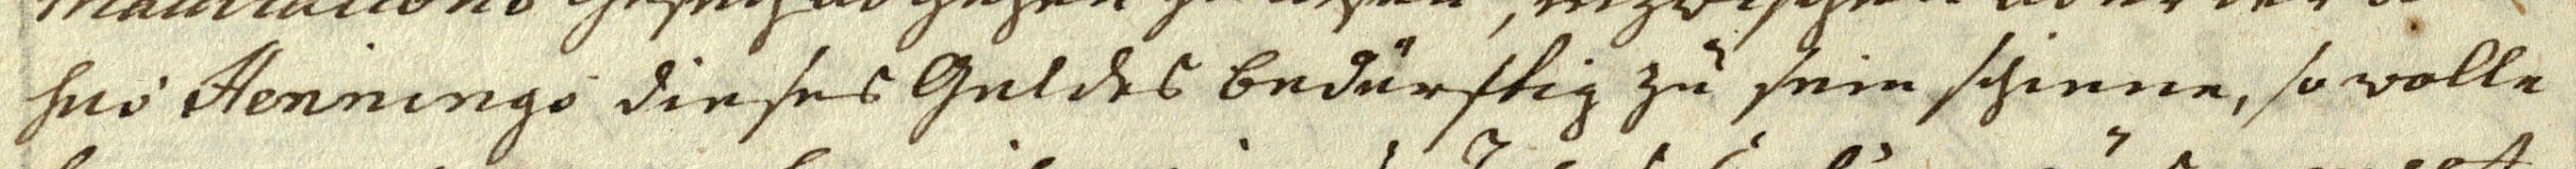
sus Hennings dieses Geldes bedürftig zu sein schiene, so wolle
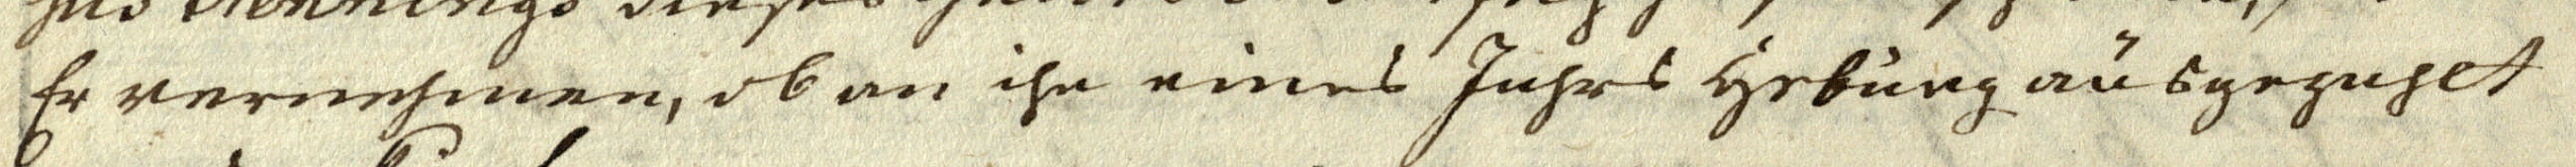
Er vernehmen, ob an ihn eines Jahrs Hebung ausgezahlt
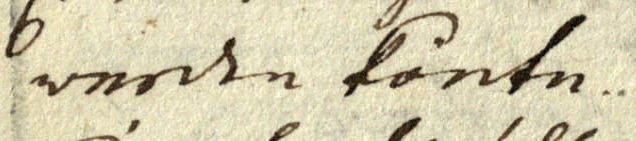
werden könte.
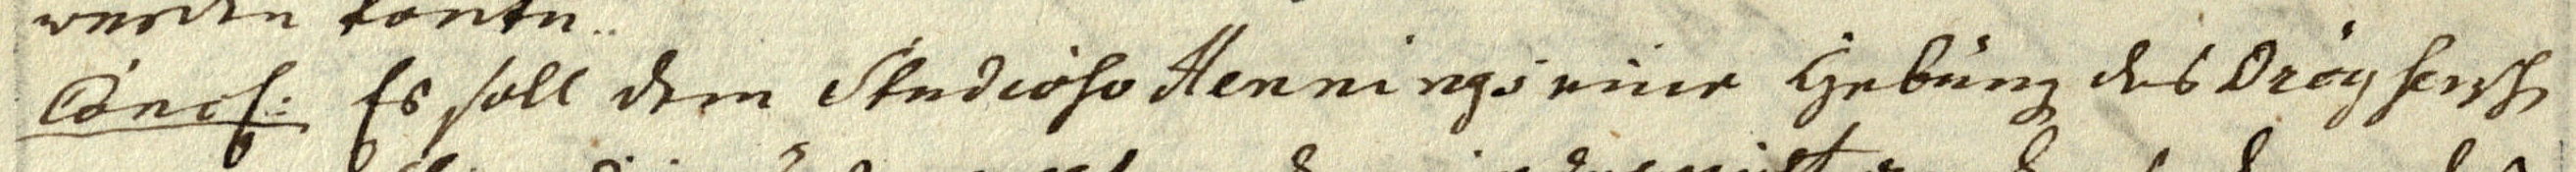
Concl. Es soll dem Studioso Hennings eine Hebung des Droÿsenschen
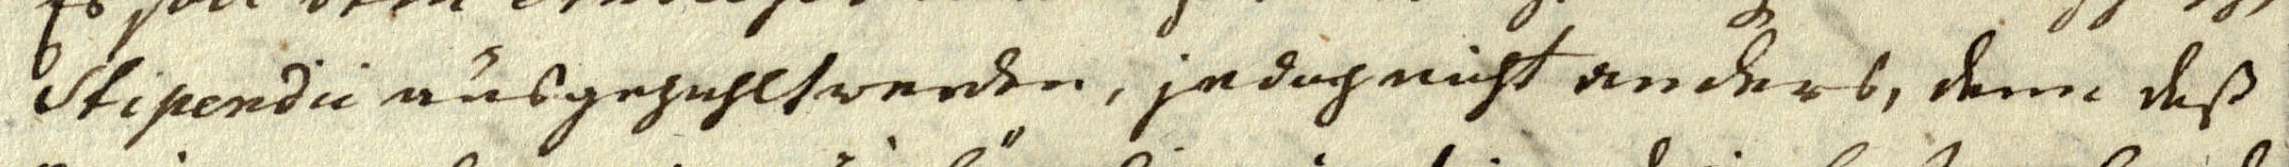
Stipendii ausgezahlt werden, jedoch nicht anders, denn daß
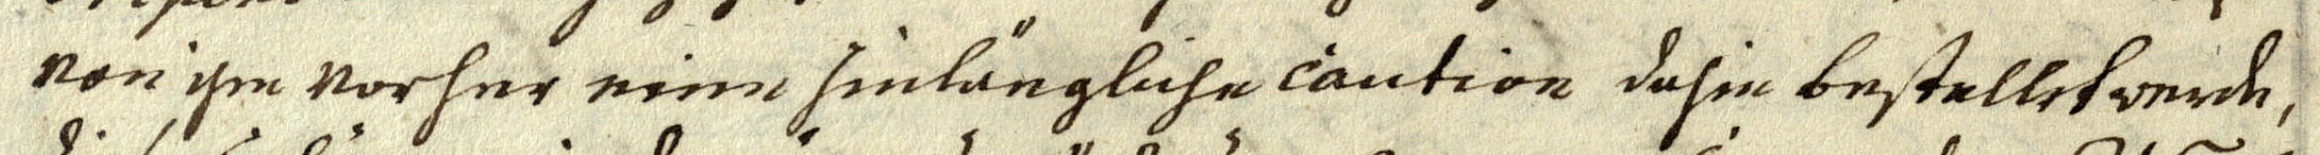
von ihm vorher eine hinlängliche Caution dahin bestellet werde,
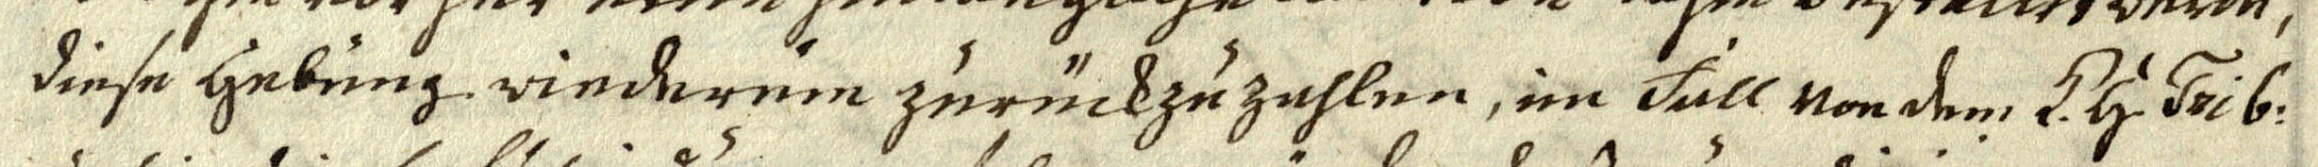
diese Hebung wiederum zurückzuzahlen, im Fall von dem K. H. Trib.
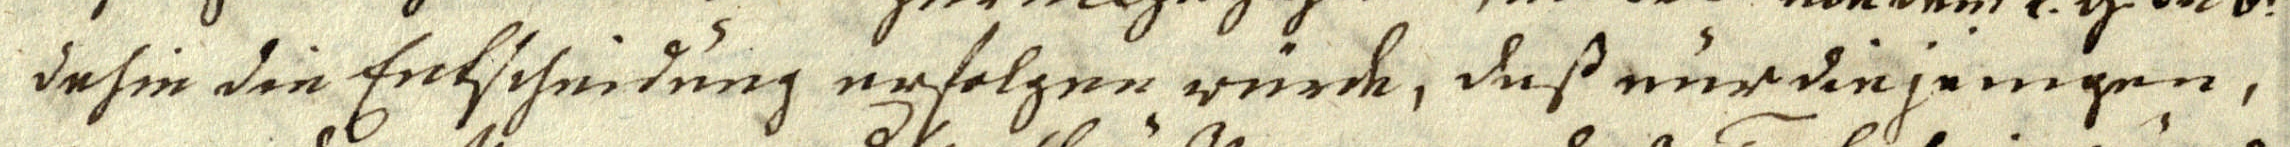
dahin die Entscheidung erfolgen würde, daß nur diejenigen,
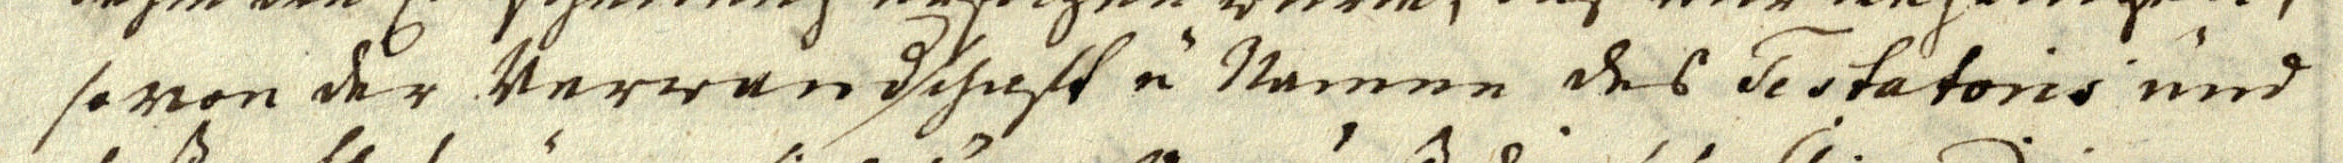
so von der Verwandschaft u Namen des Testatoris und
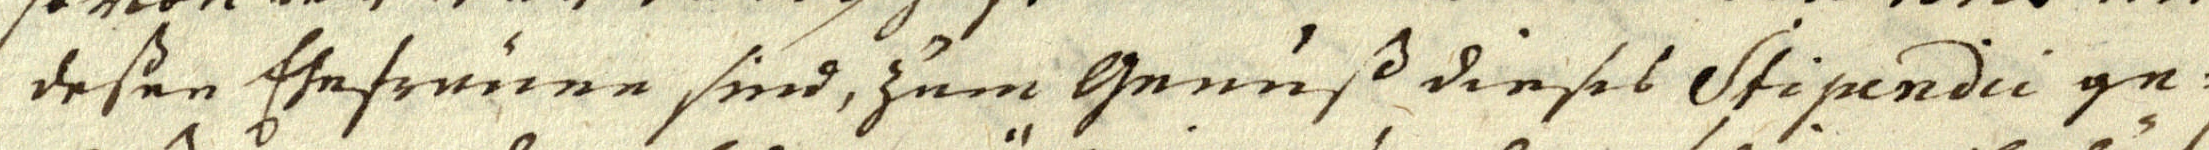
deßen Ehefrauen sind, zum Genuß dieses Stipendii ge¬
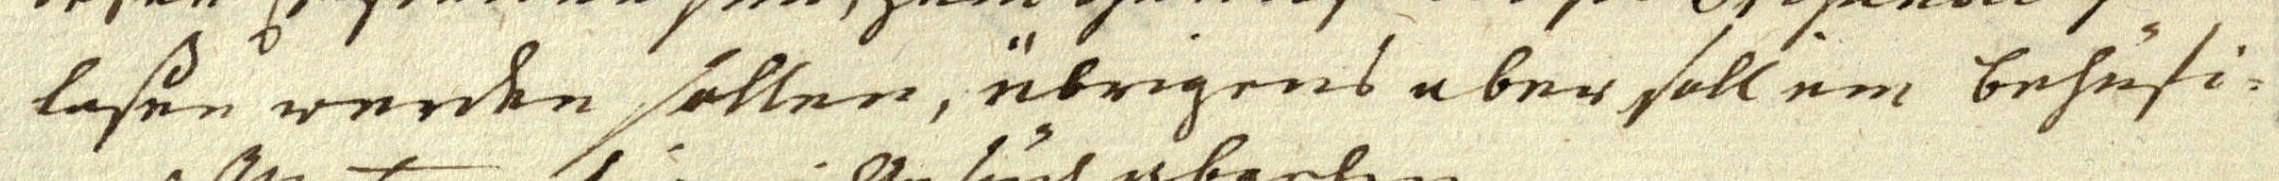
laßen werden sollen, übrigens aber soll ein behufi¬
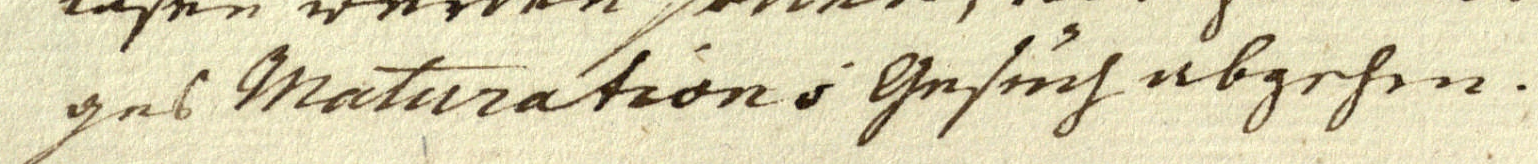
ges Maturations Gesuch abgehen.
